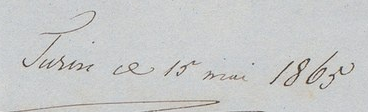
Turin le 15 mai 1865
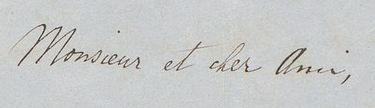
Monsieur et cher Ami,
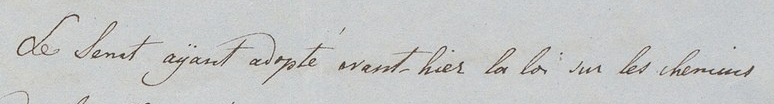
Le Senat ayant adopté avant-hier la loi sur les chemins
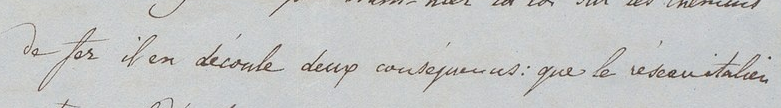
de fer il en découle deux conséquences: que le réseau italien
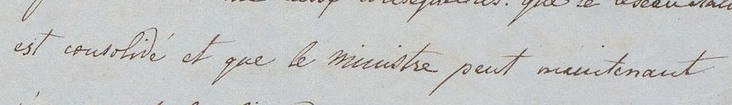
est consolidé et que le Ministre peut maintenant
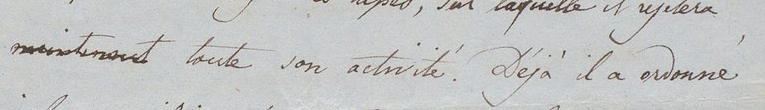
maintenant toute son activité. Déjà il a ordonné
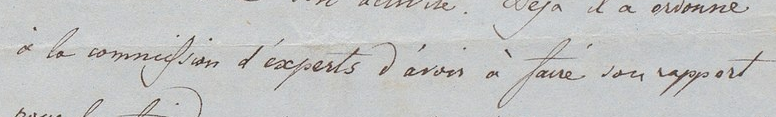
à la commission d'experts d'avoir à faire son rapport
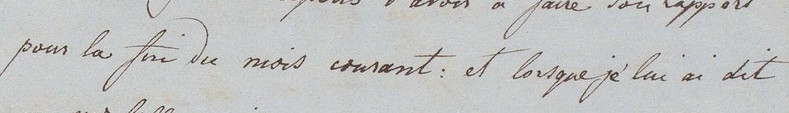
pour la fin du mois courant: et lorsque je lui ai dit
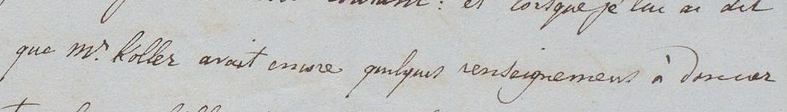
que MrKoller avait encore quelques renseignemens à donner
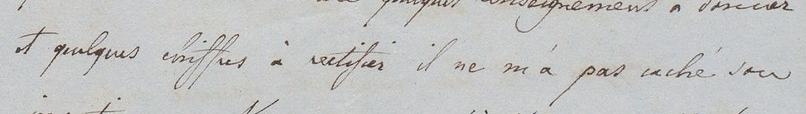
et quelques chiffres à rectifier il ne m'a pas caché son
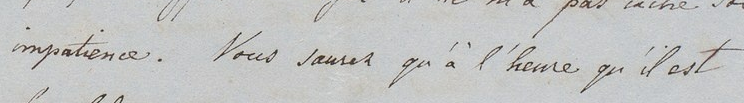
impatience. Vous saurez qu'à l'heure qu'il est
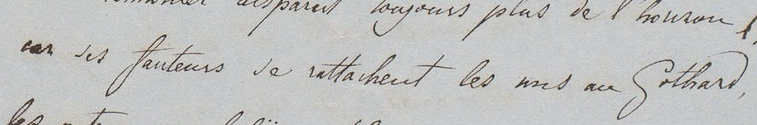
car ses fauteurs se rattachent les uns au Gothard,
